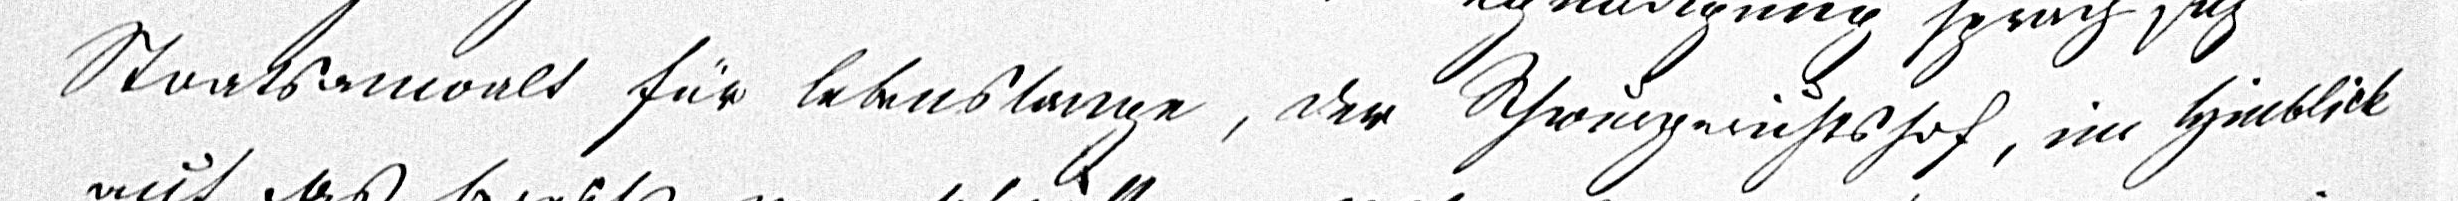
Staatsanwalt für lebenslange, der Schwurgerichtshof, im Hinblick
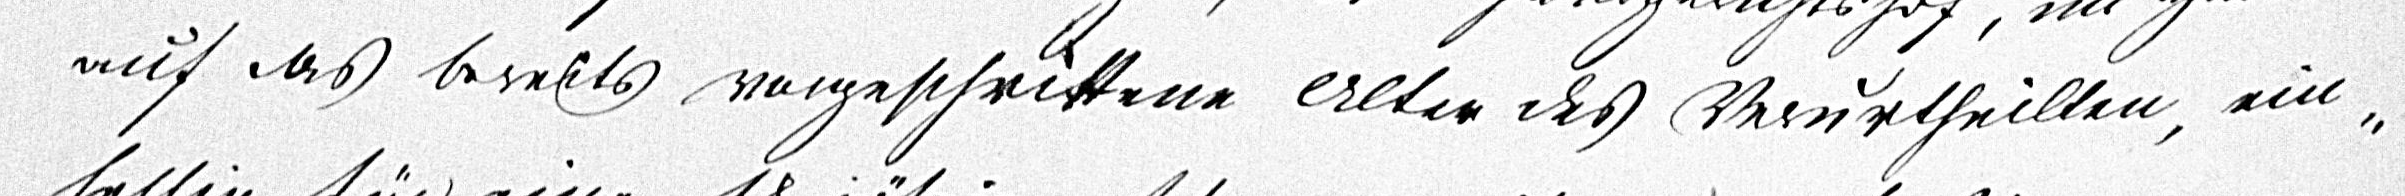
auf das bereits vorgeschrittene Alter des Verurtheilten, ein¬
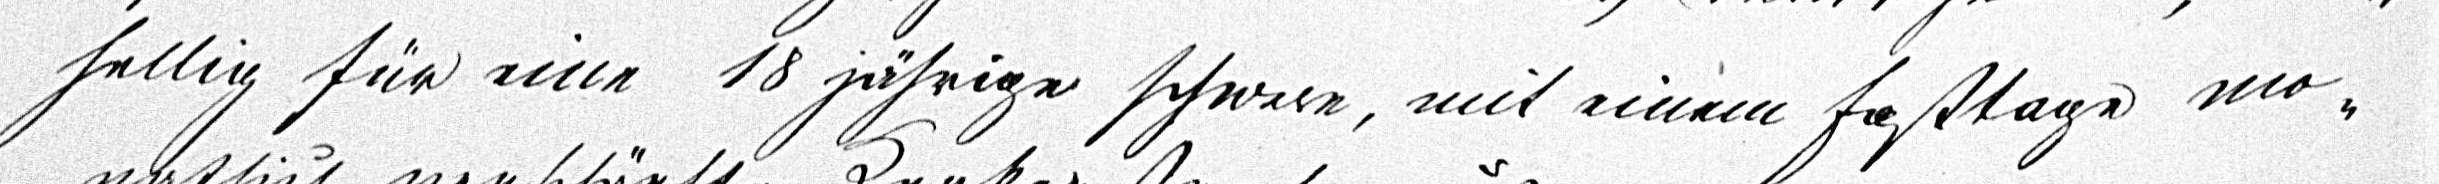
hellig für eine 18 jährige schwere, mit einem Fasttage mo¬
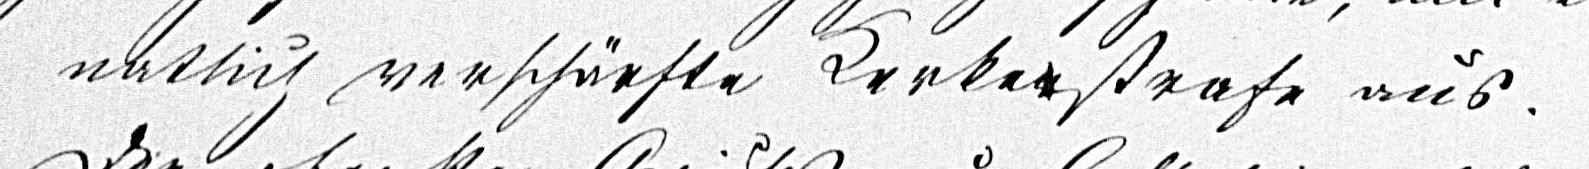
nathich verschärfte Kerkerstrafe aus.
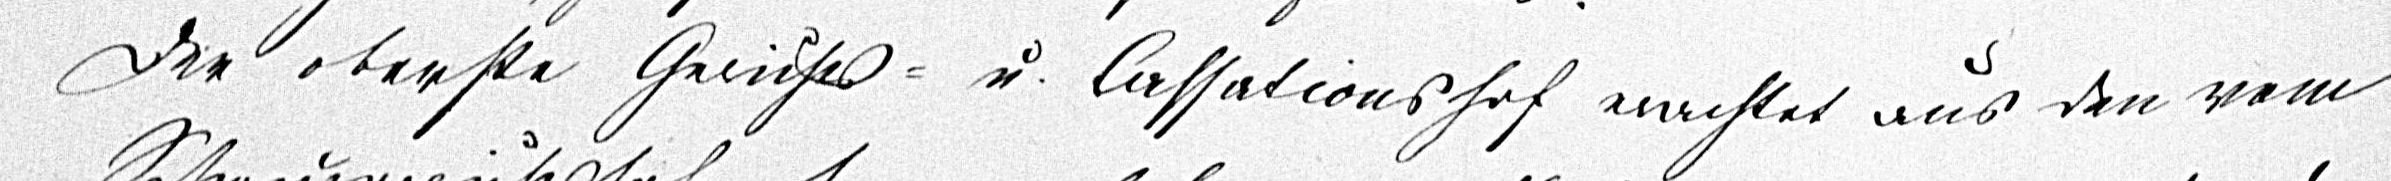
Die oberste Gerichts- u. Cassationshof nachtet aus den vom
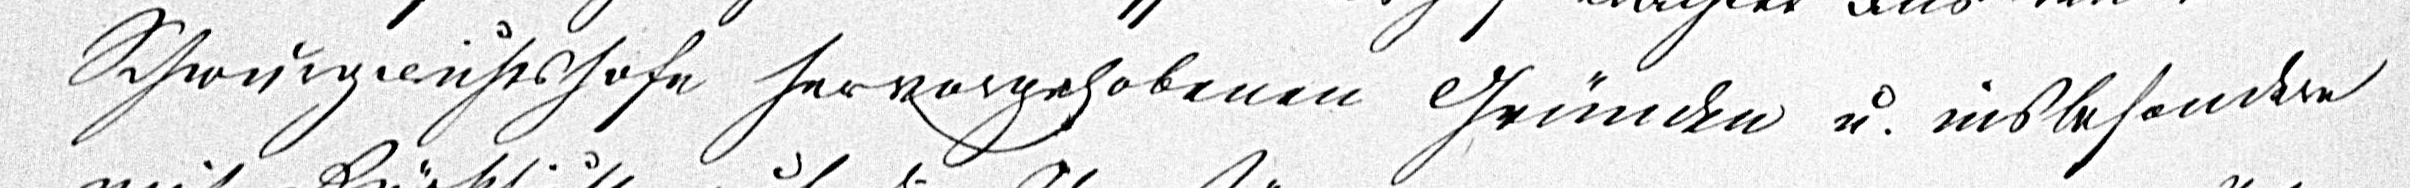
Schwurgerichtshofe hervorgehobenen Gründen u. insbesondere
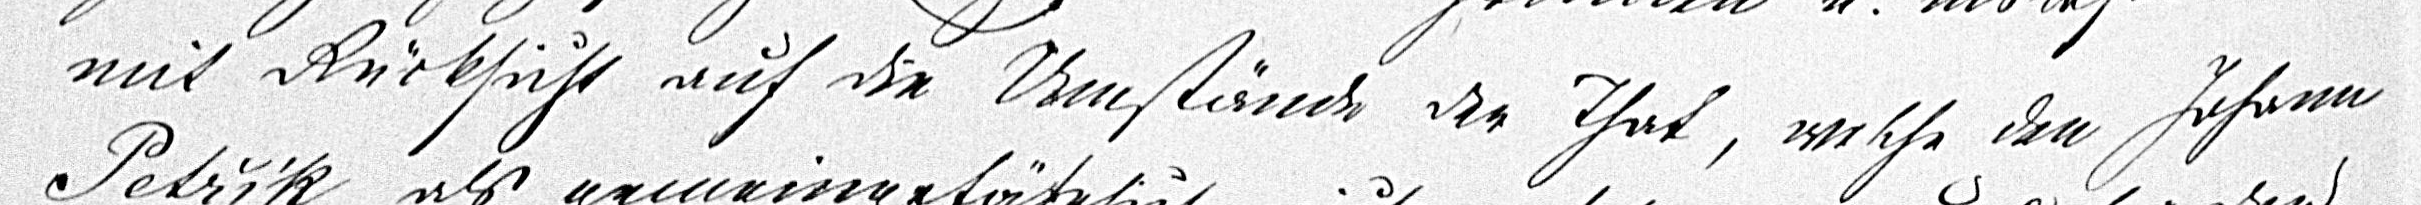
mit Rücksicht auf die Umstände der That, welche den Johann
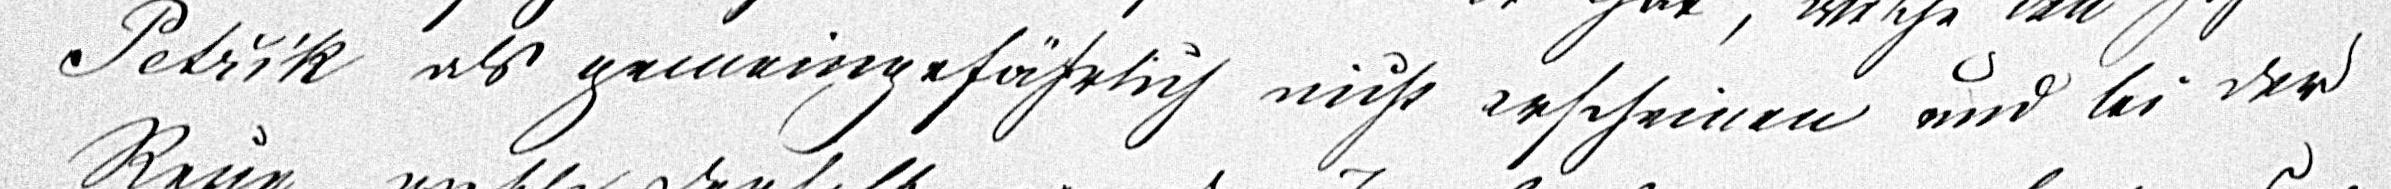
Petxx als gemeingefährlich nicht erscheinen und bei der
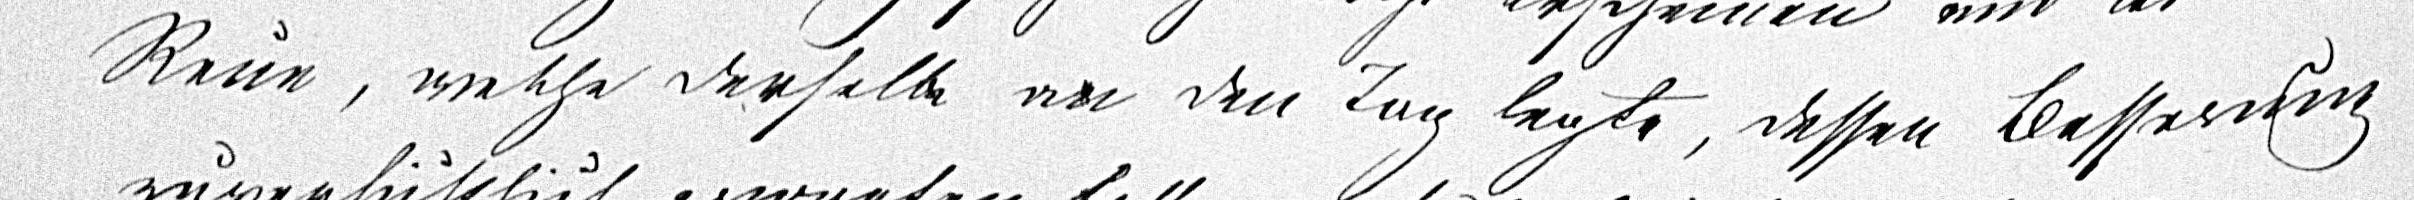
Reue, welche derselbe an den Tag legte, dessen Besserung
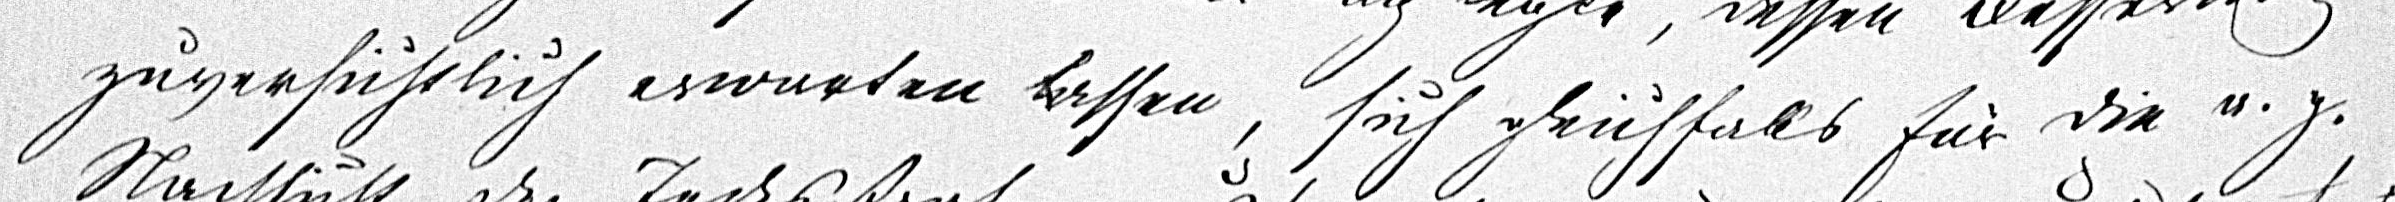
zuversichtlich erwarten lassen, sich gleichfalls für die a. g.
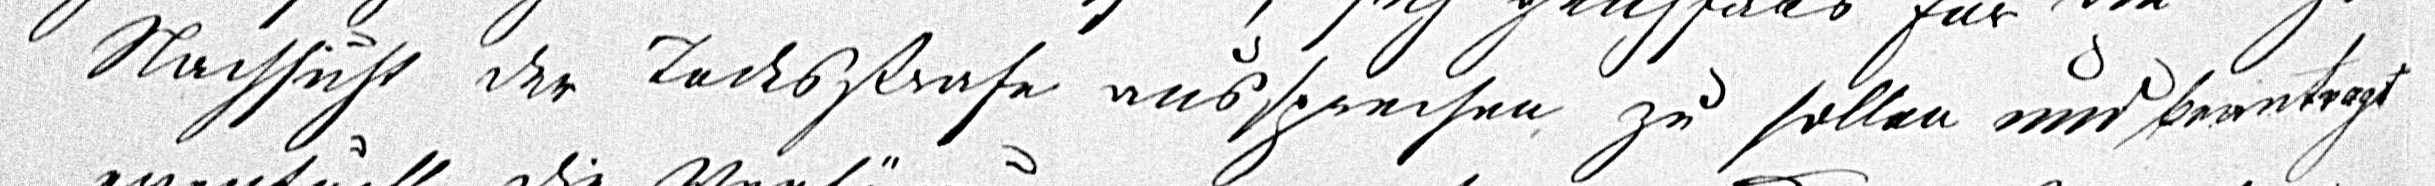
Nachsicht der Todesstrafe aussprechen zu sollen und beantragt
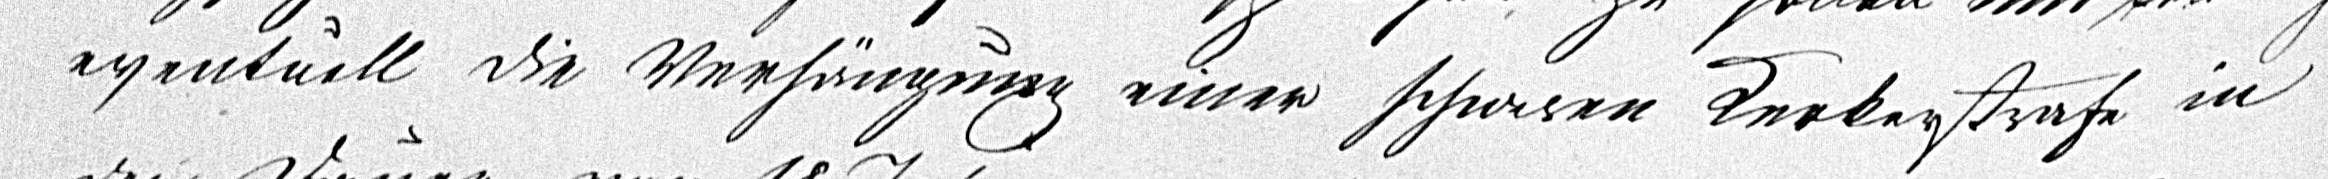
eventuell die Verhängung einer schweren Kerkerstrafe in
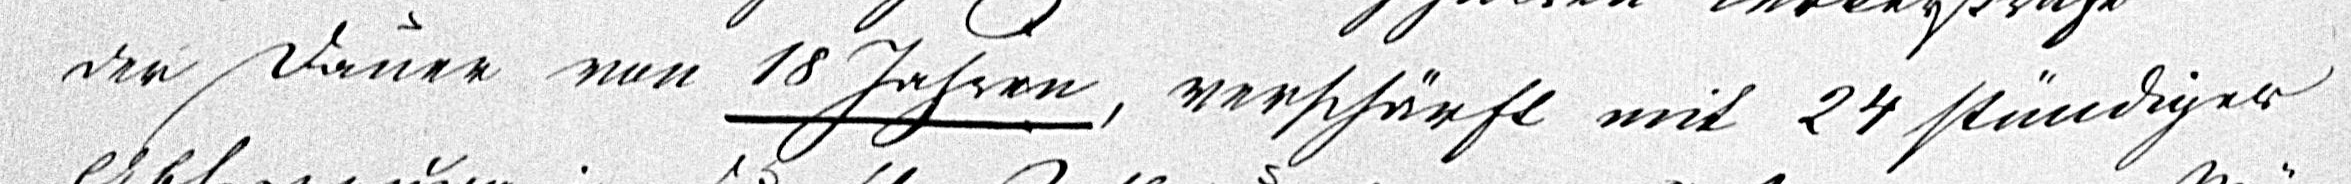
der Dauer von 18 Jahren, verschärft mit 24 ständiger
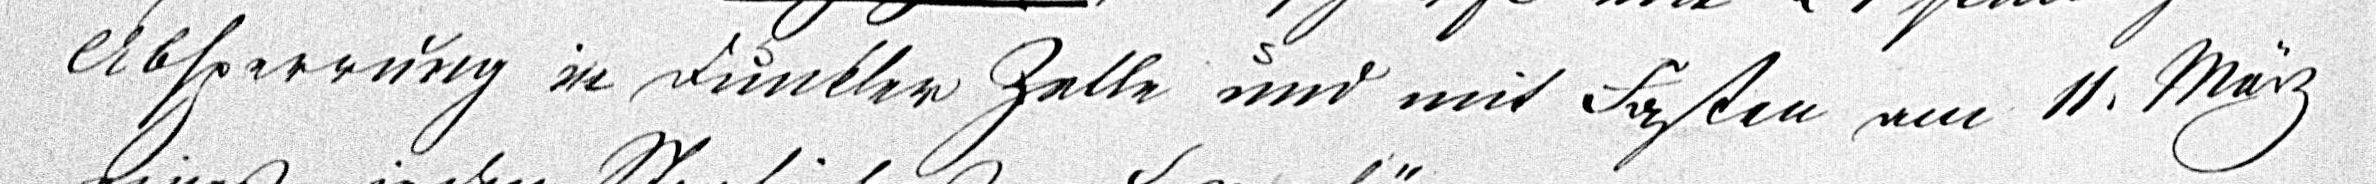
Absperrung in Dunkler Zelle und mit Fasten am 11. März
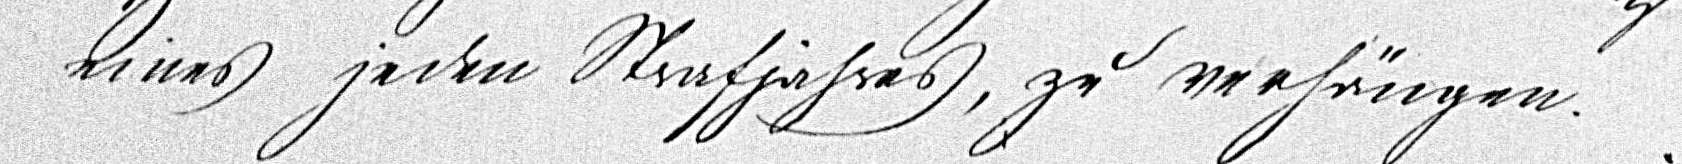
eines jeden Strafjahres, zu verhängen.
